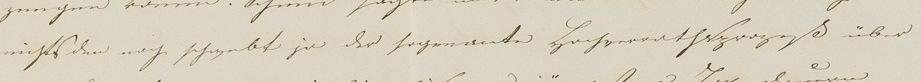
nichts den noch schwebt ja der sogenante Hochverrathsprozeß über
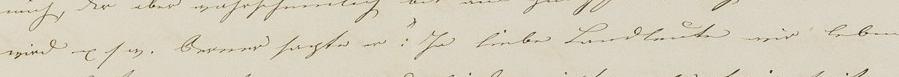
wird &sw. Ferner sagte er: «Ja liebe Landleute wir leben
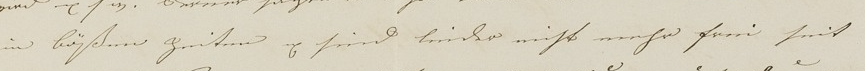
in bößen Zeiten & sind leider nicht mehr frei seit
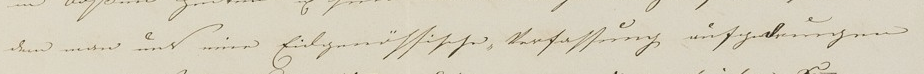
dem man uns eine Eidgenössische-Verfassung aufgedrungen
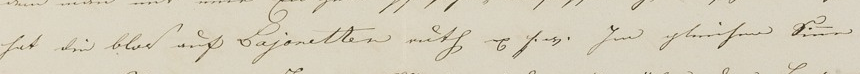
hat die blos auf Bajonetten ruth &s. w.» Im gleichen Sinne
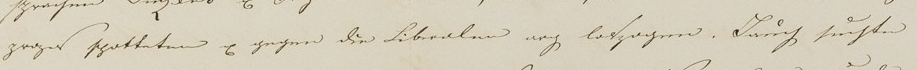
prozes spotteten & gegen die Liberalen arg loszogen. Jauch suchte
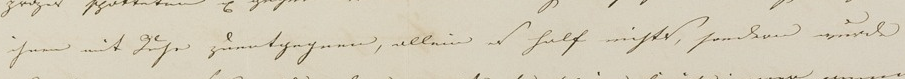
ihnen mit Ruhe zuentgegnen, allein es half nichts, sondern wurde
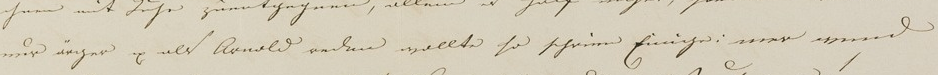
nur ärger & als Arnold reden wollte so schrien Einige: mer wend
